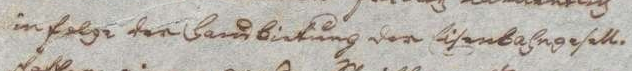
in Folge der Handbietung der Eisenbahngesell-
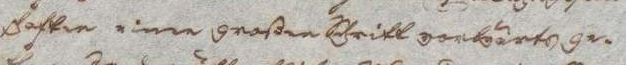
schaften einen großen Schritt vorwärts ge-
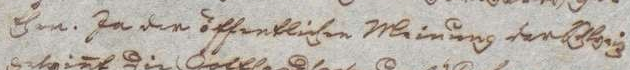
than. In der öffentlichen Meinung der Schweiz
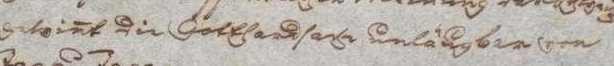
gewinnt die Gotthardsache unläugbar von
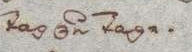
Tag zu Tage.
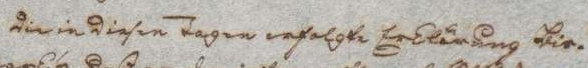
Die in diesen Tagen erfolgte Erklärung Bis-
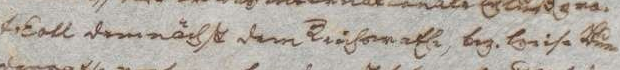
tokoll demnächst dem Reichsrathe, bez.weise Bun-
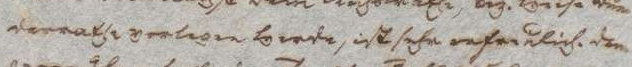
desrathe vorlegen werde, ist sehr erfreulich. Dem-
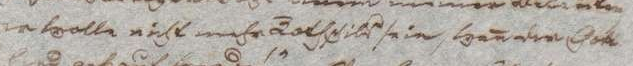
«er wolle nicht mehr Rothschild sein, wenn der Gott-
